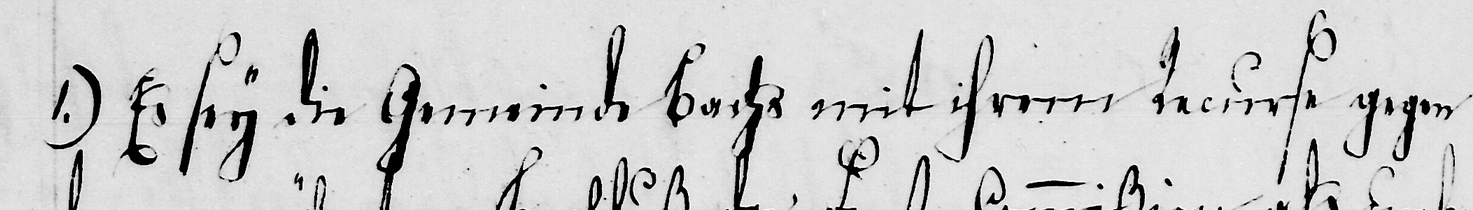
1.) Es sey die Gemeinde Bachs mit ihrem Recurse gegen
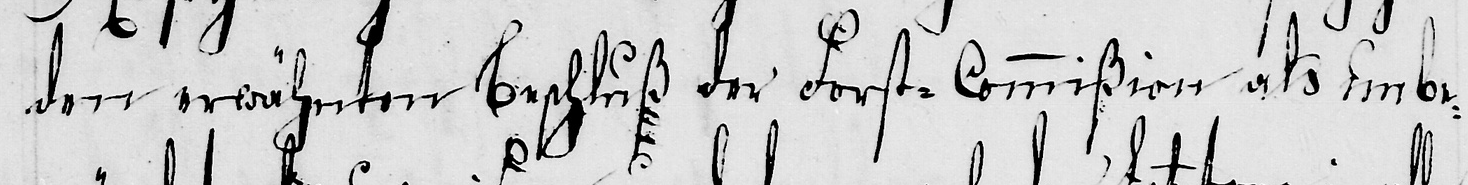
den erwähnten Beschluß der Forst-Commißion als unbe¬
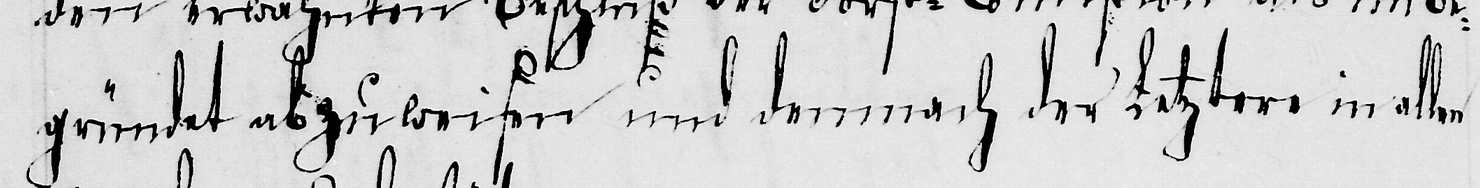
gründet abzuweisen und demnach der Letztere in al¬
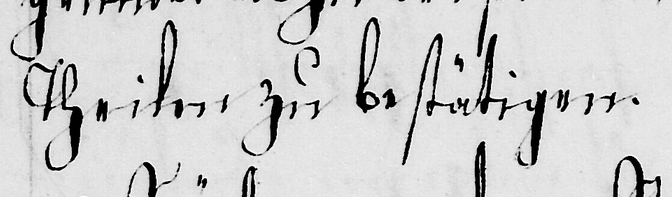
Theilen zu bestätigen.
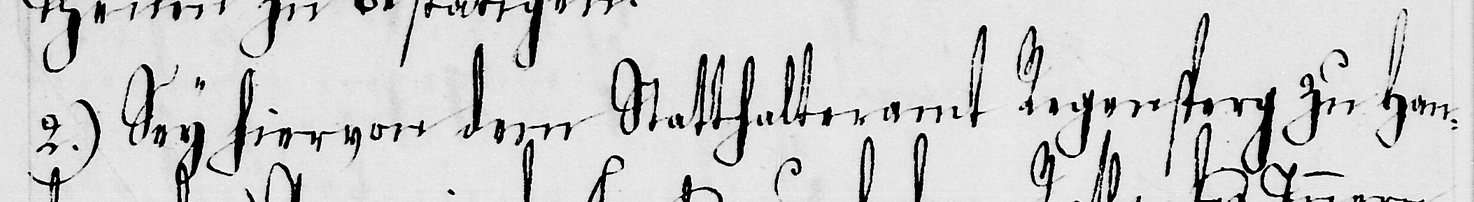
2.) Sey hiervon dem Statthalteramt Regensperg zu Han¬
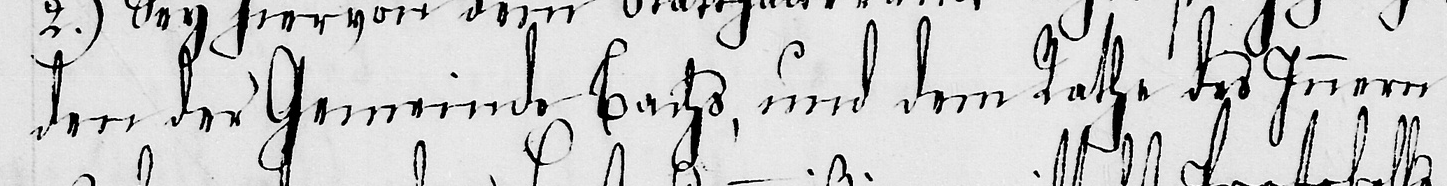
den der Gemeinde Bachs, und dem Rathe des Innern
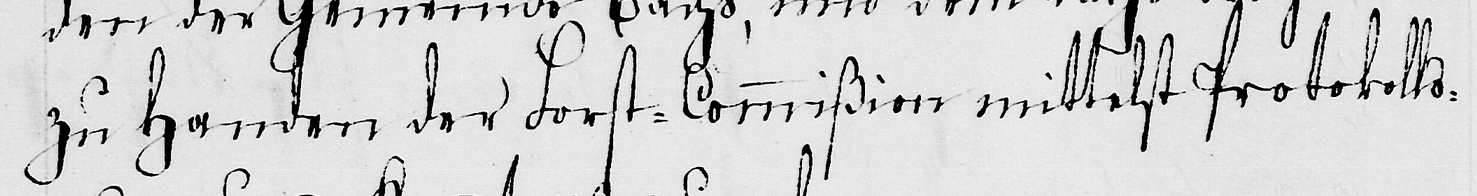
zu Handen der Forst-Commißion mittelst Protokoll¬
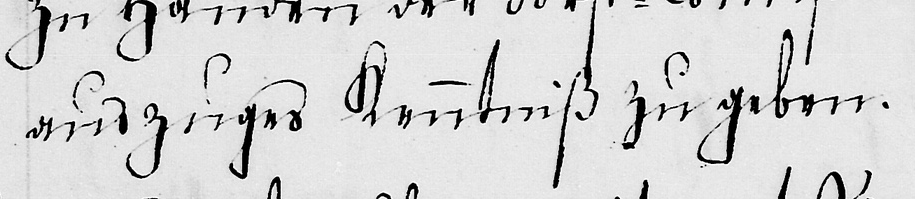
sauszuges Kenntniß zu geben.
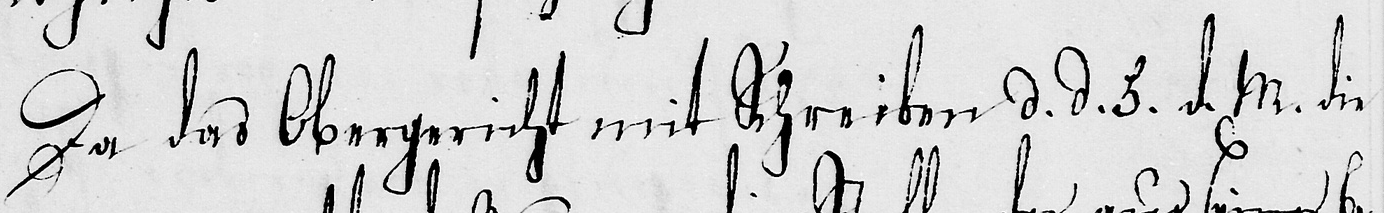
Da das Obergericht mit Schreiben d. d. 5. d. M. die
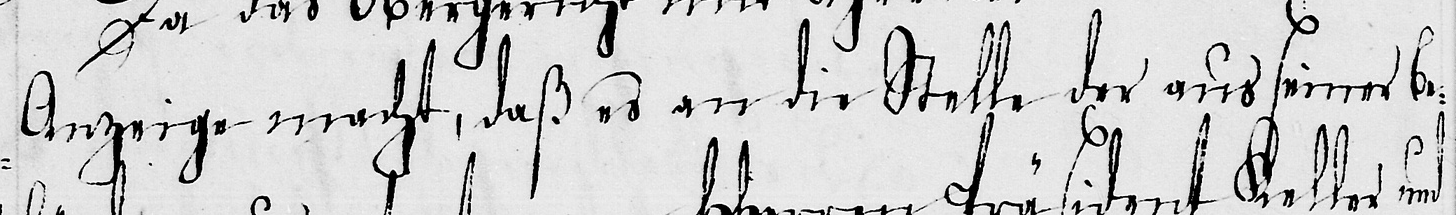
Anzeige macht, daß es an die Stelle der aus seiner B¬
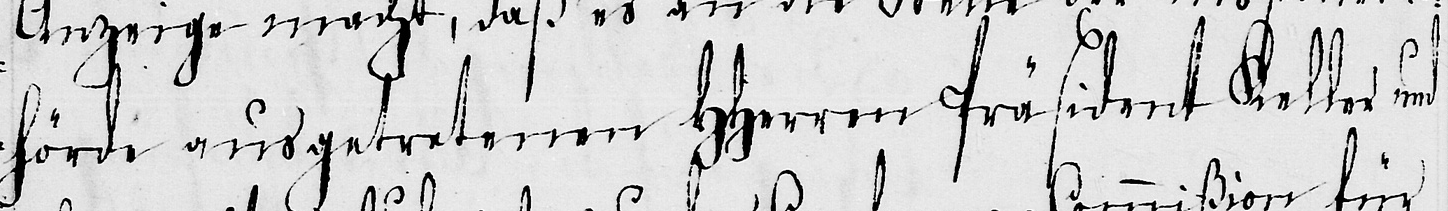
hörde ausgetretenen HHerren Präsident Keller
